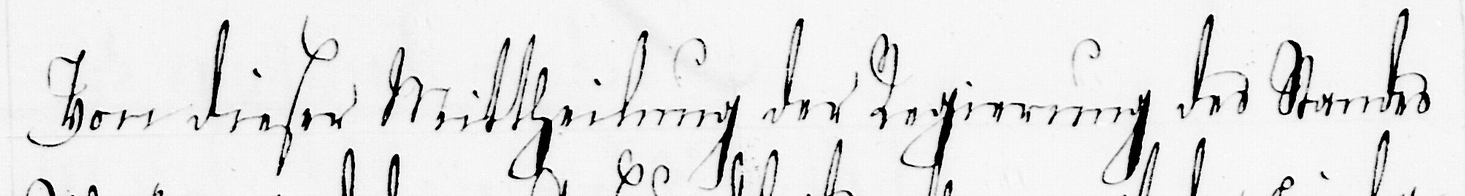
Von dieser Mittheilung der Regierung des Standes
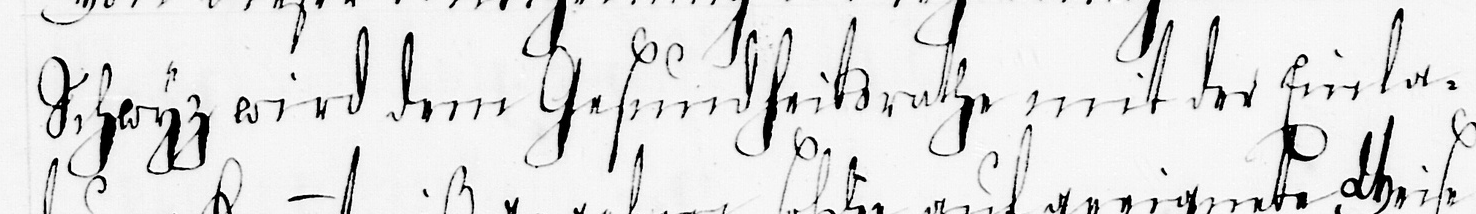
Schwyz wird dem Gesundheitsrathe mit der Einla¬
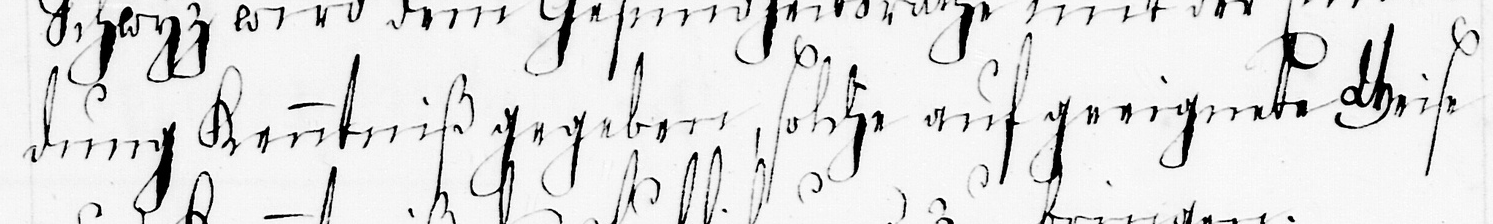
dung Kenntniß gegeben, solche auf geeignete Weise
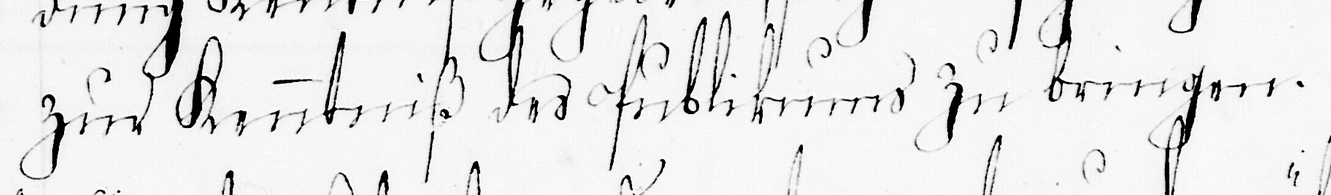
zur Kenntniß des Publikums zu bringen.
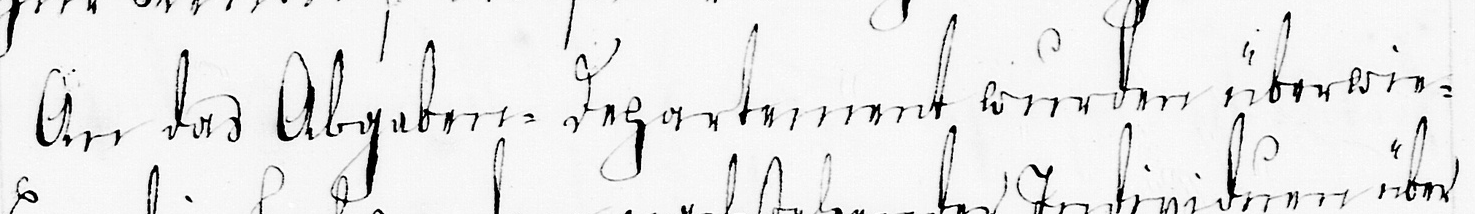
An das Abgaben-Departement wurden überwie¬
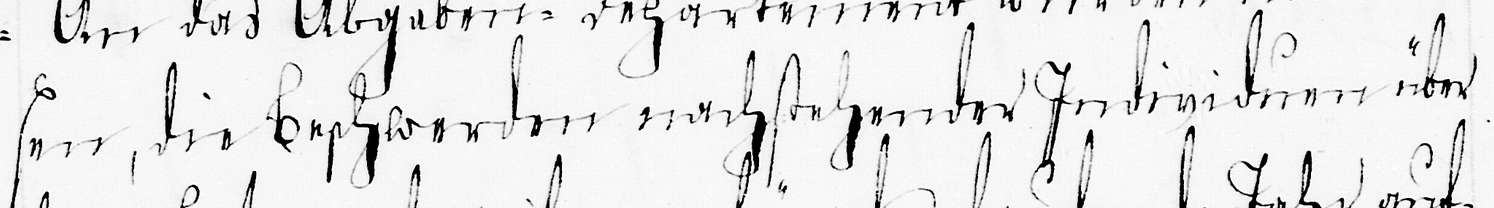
sen, die Beschwerden nachstehender Individuen über
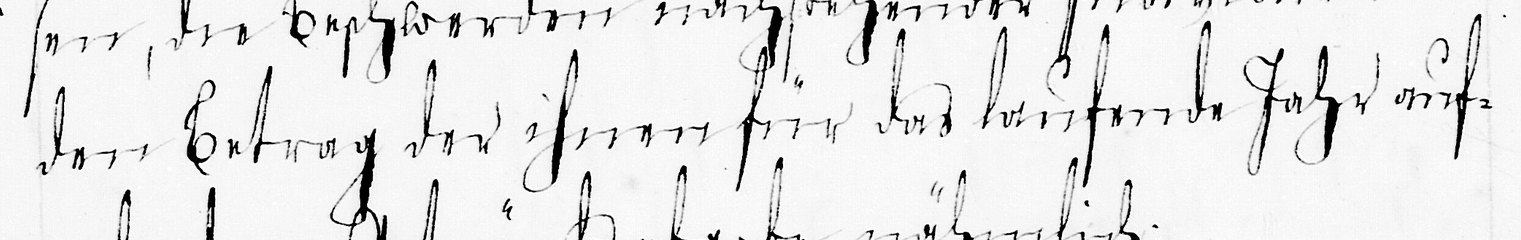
den Betrag der ihnen für das laufende Jahr auf¬
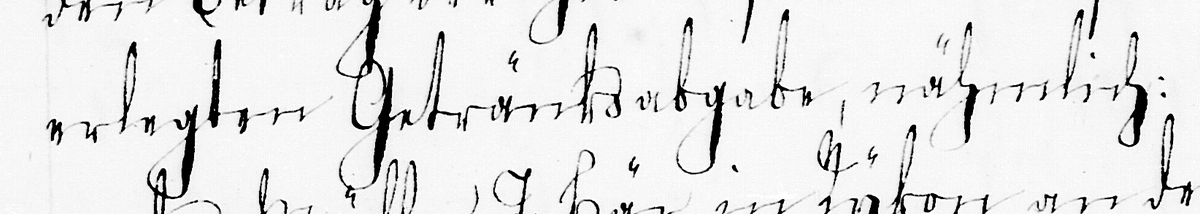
erlegten Getränksabgabe, nähmlich:
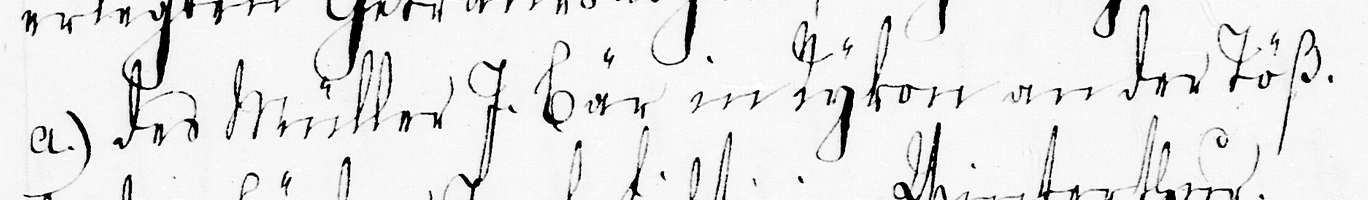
a.) des Müller J. Bär in Rykon an der Töß.
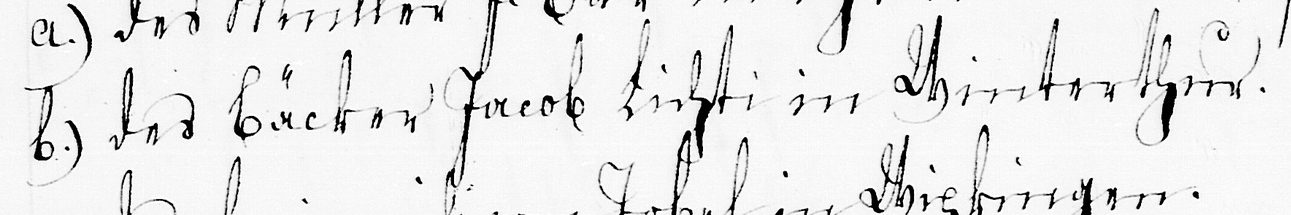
b.) des Bäcker Jacob Lichti in Winterthur.
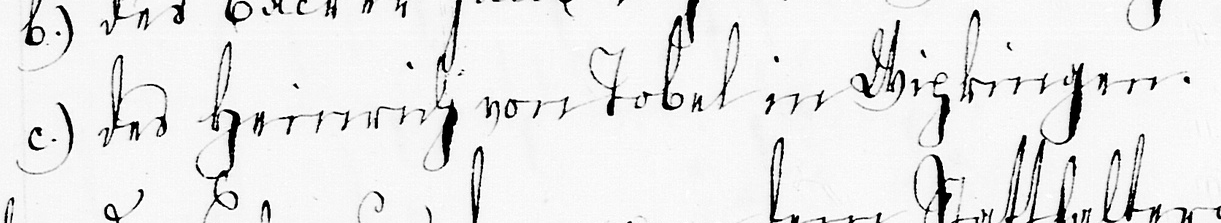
c.) des Heinrich von Tobel in Wipkingen.
